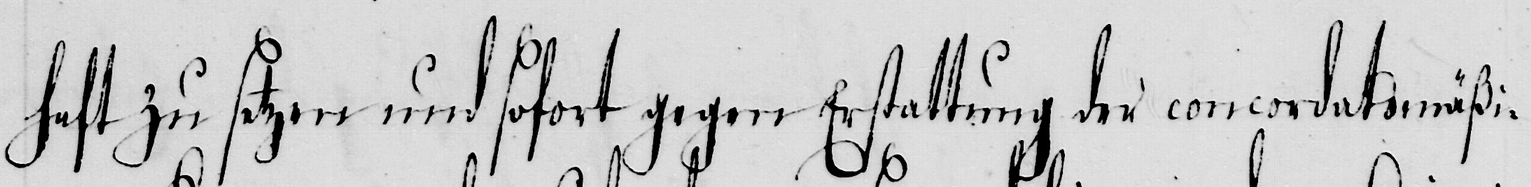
haft zu setzen und sofort gegen Erstattung der concordatsmä¬
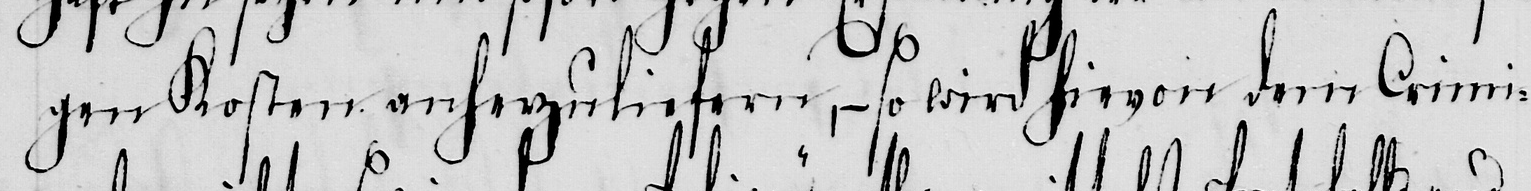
gen Kosten anherzuliefern, – so wird hievon dem Crimi¬
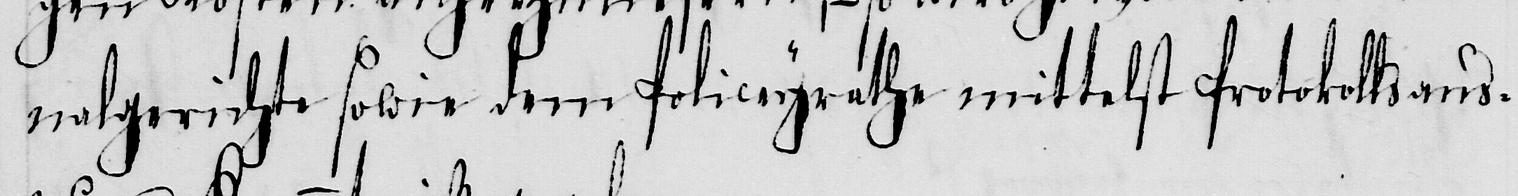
nalgerichte sowie dem Policeyrathe mittelst Protokollsaus¬
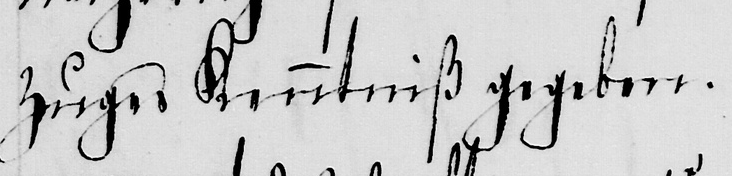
zug Kenntniß gegeben.
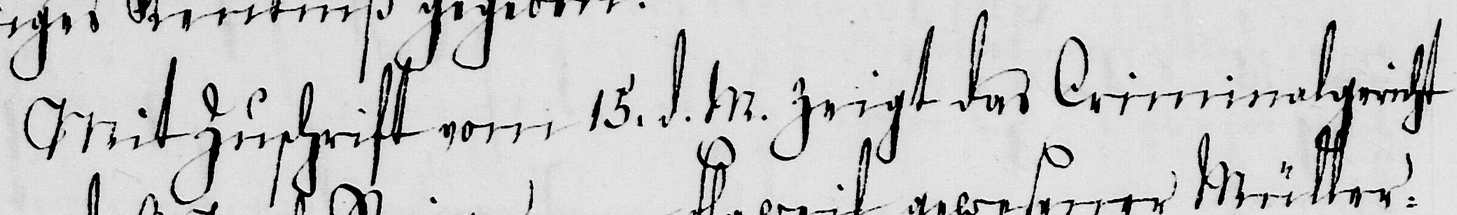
Mit Zuschrift vom 15. d. M. zeigt das Criminalgericht
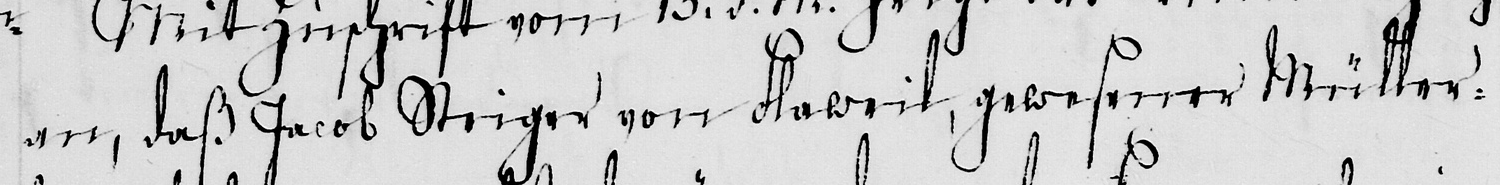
an, daß Jacob Steiger von Flaweil, gewesener Müller¬
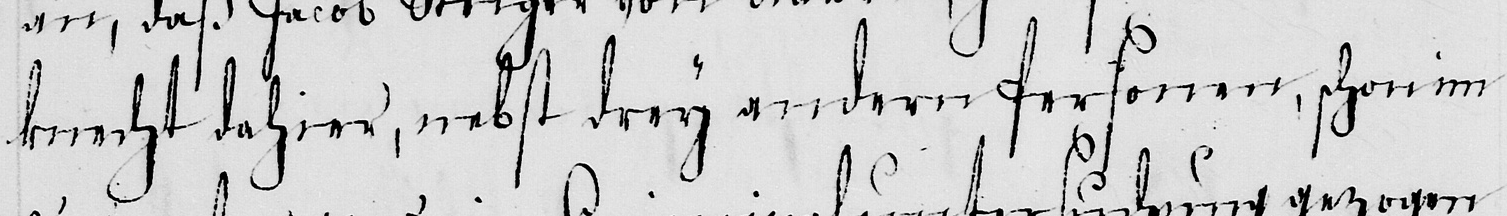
knecht dahier, nebst drey andern Personen, schon im
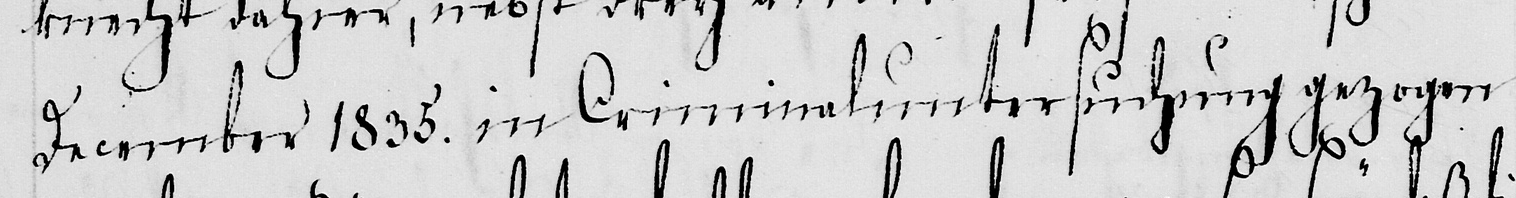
December 1835. in Criminaluntersuchung gezogen
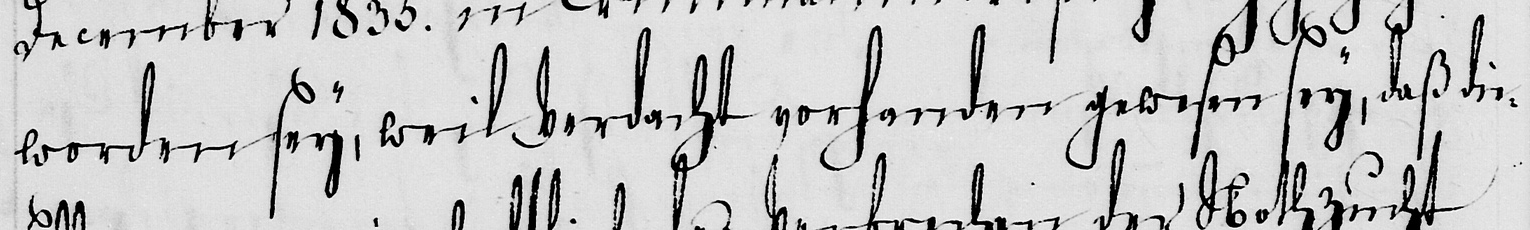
worden sey, weil Verdacht vorhanden gewesen sey, daß di¬
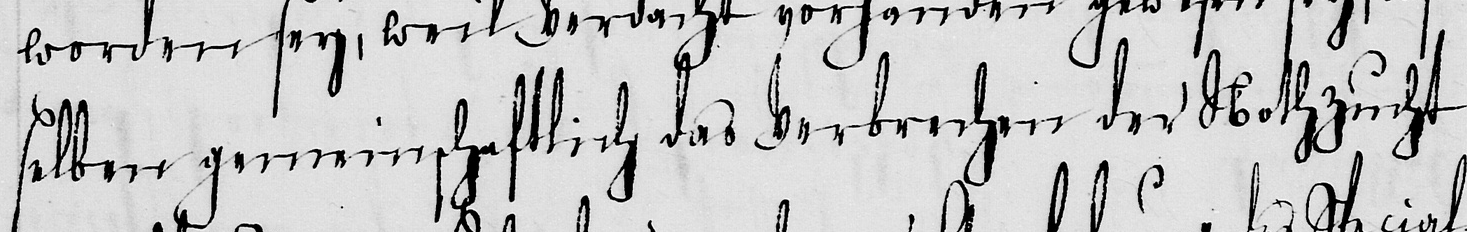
selben gemeinschaftlich das Verbrechen der Nothzucht
